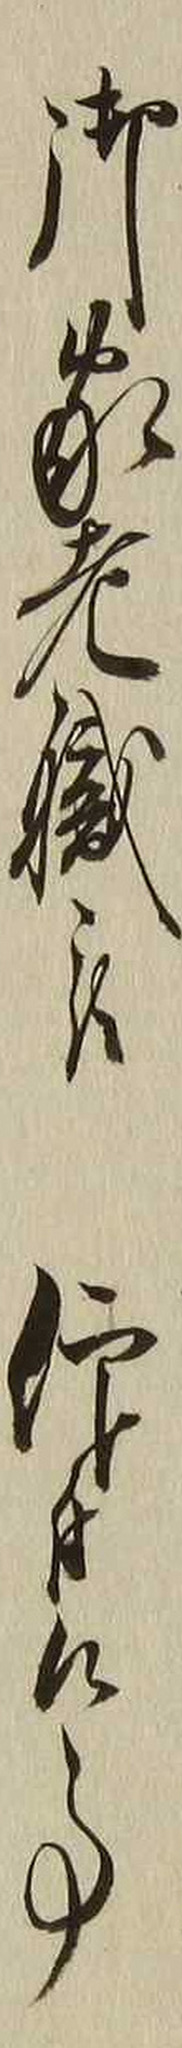御家老職被仰付候事
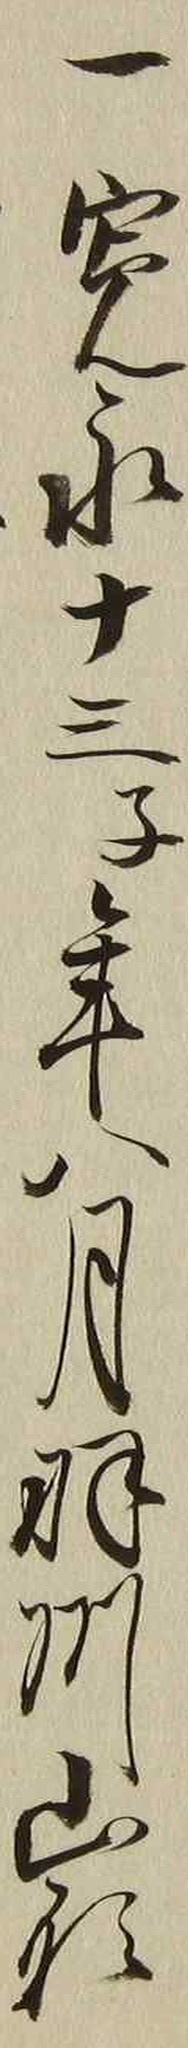一寛永十三子年八月羽州山形
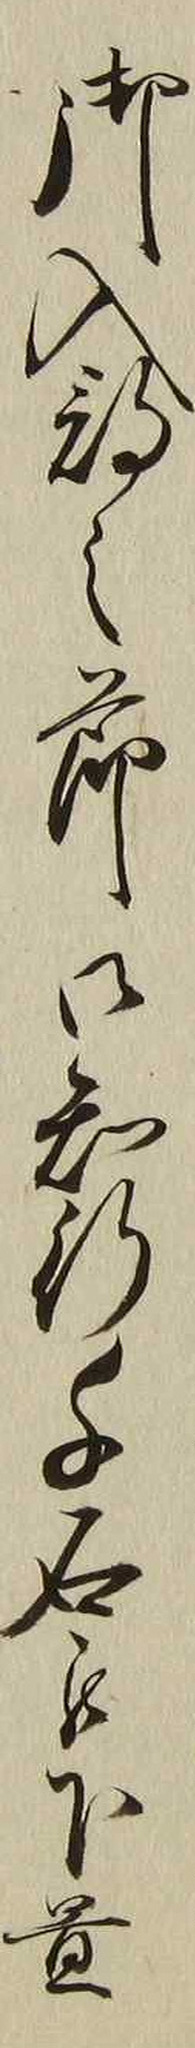御入部之節御知行千石被下置
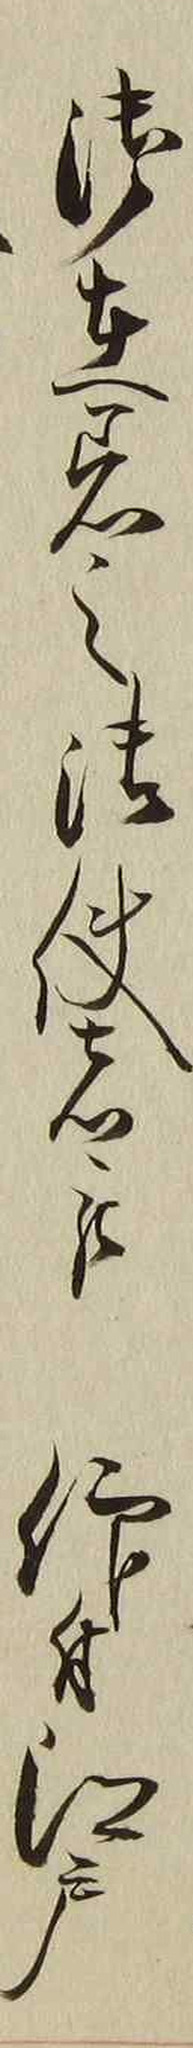御在着之御使者被仰付江戸
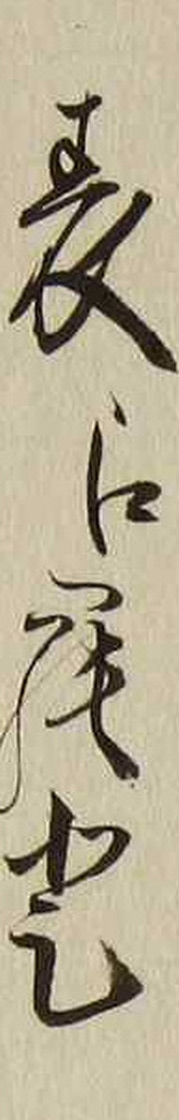表江罷登
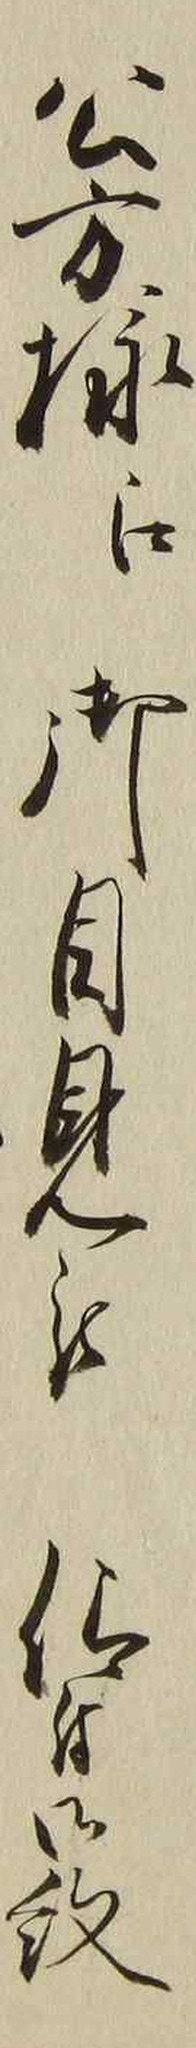公方様江御目見被仰付御紋
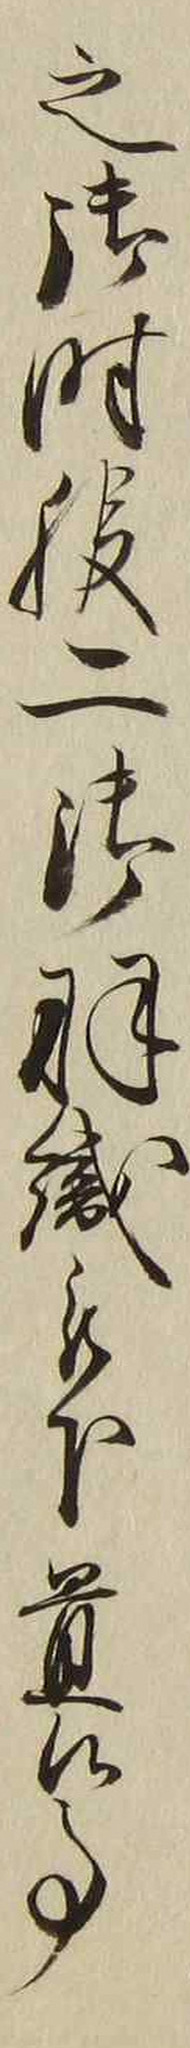之御時服二御羽織被下置候事
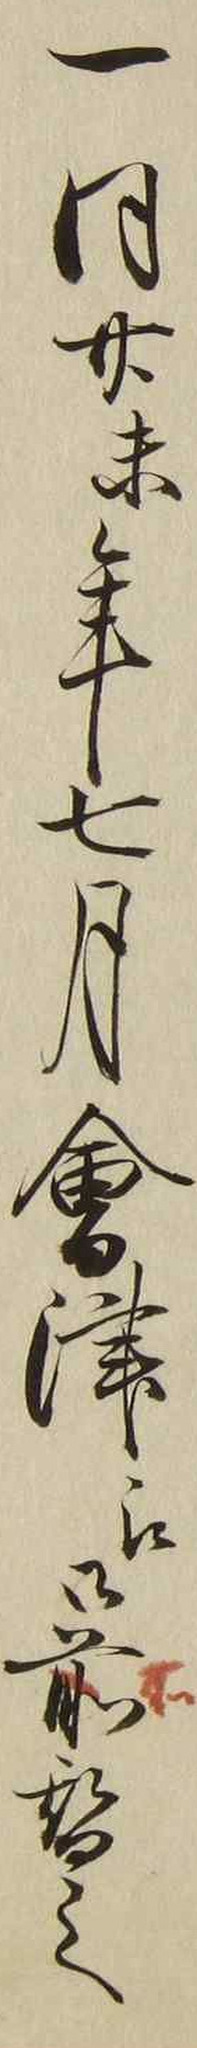一同廿未年七月会津江御前替之

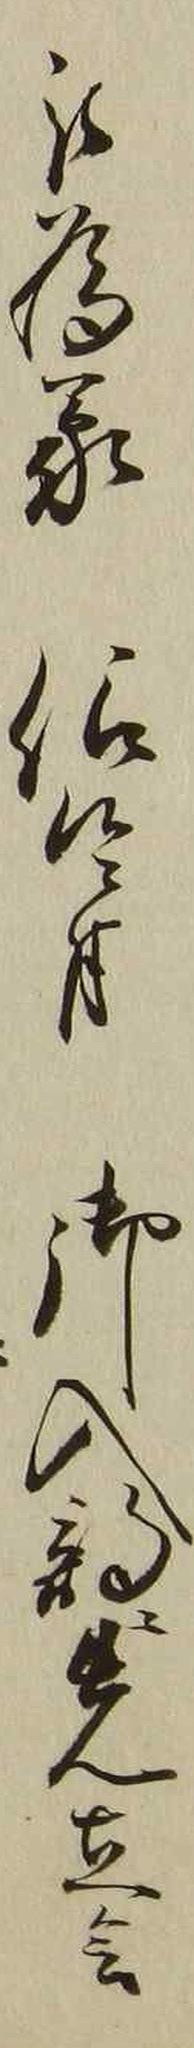被為蒙仰候に付御入部に先立会
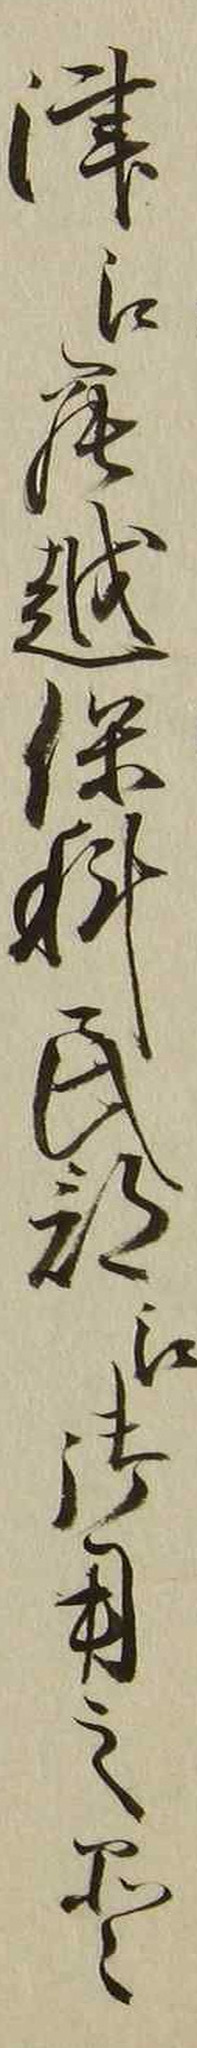津江罷越保科氏部江御用之品々
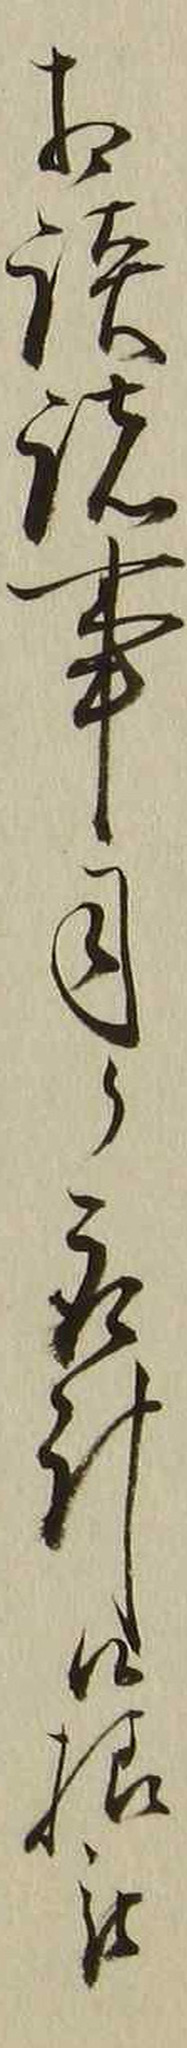相談諸事司り取計候様被
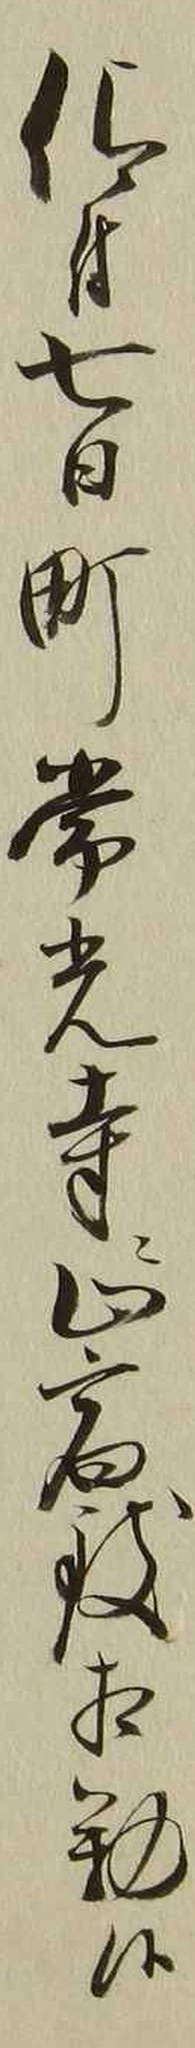仰付七日町常光寺に止宿致相勤候
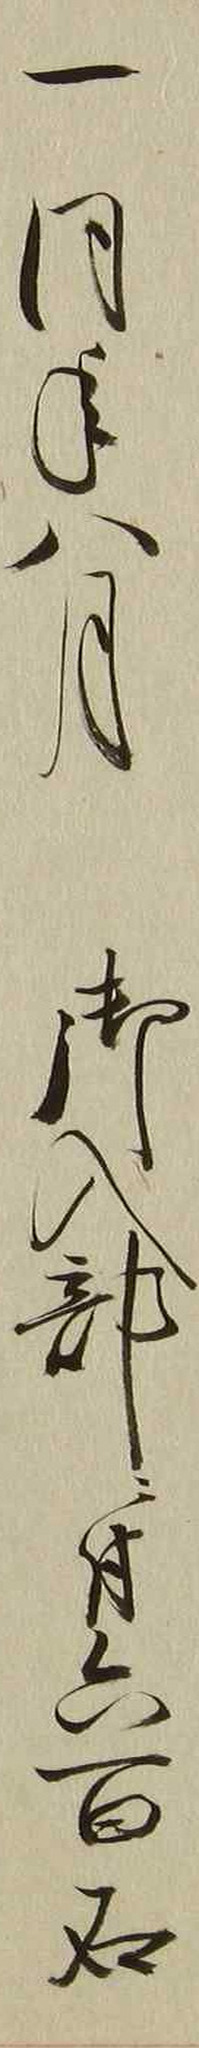一月年八月御入部に付六百石
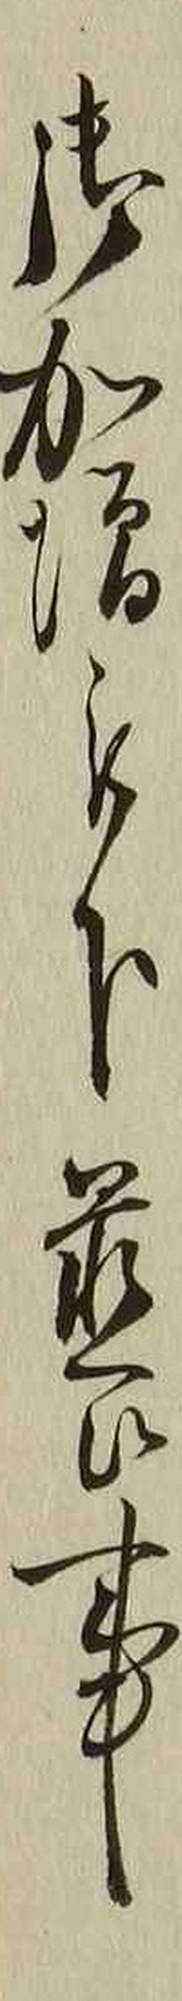御加増被下置候事
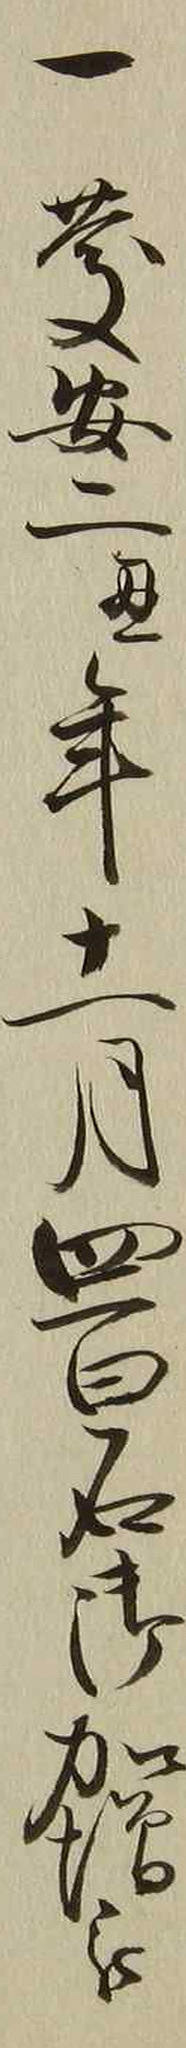一慶安二丑年十一月四百石御加増被
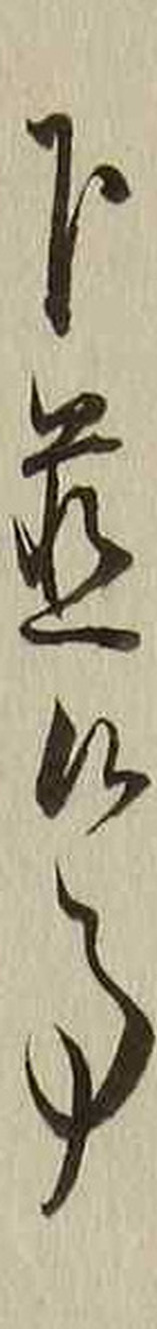下置候事
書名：諸士系譜　巻之77　を之部11
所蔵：会津若松市立会津図書館
